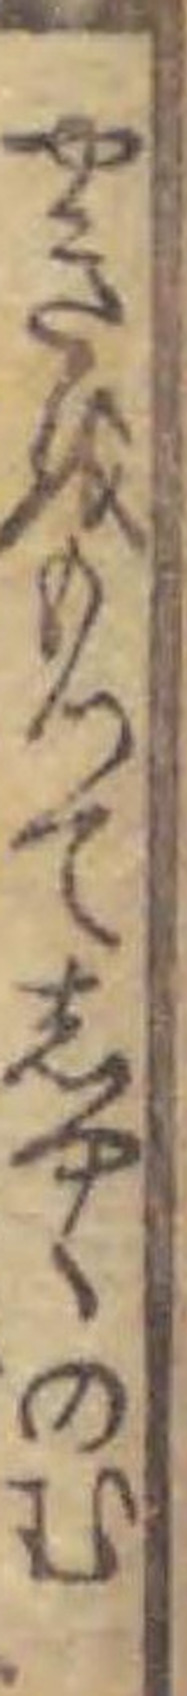やきをもつてしやくのむ
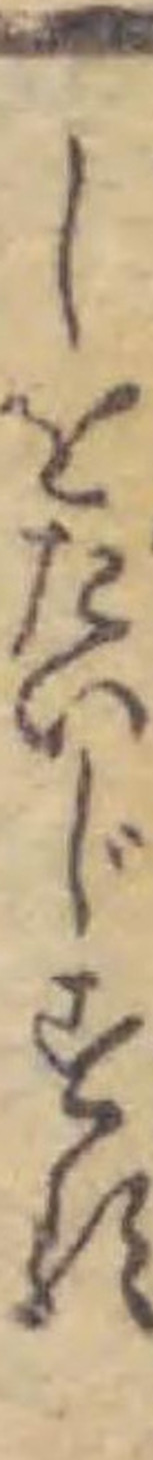しをたいじする
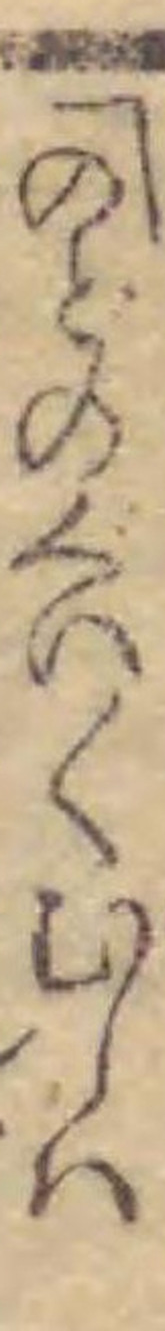〽のどのぐい〳〵むしは
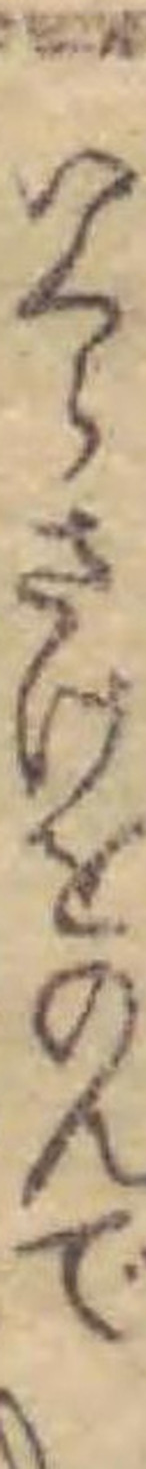いくらさけをのんで
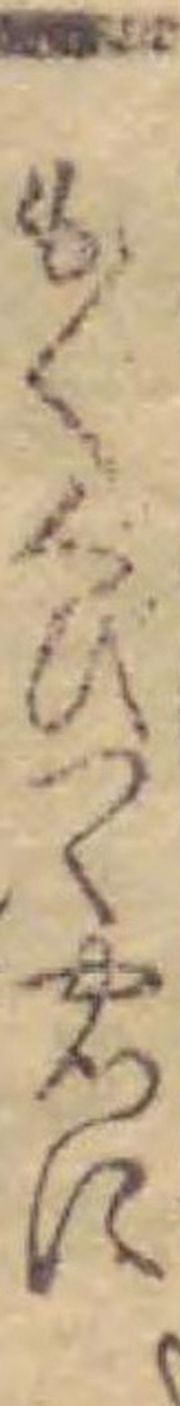も〳〵ぐびつゝやつに
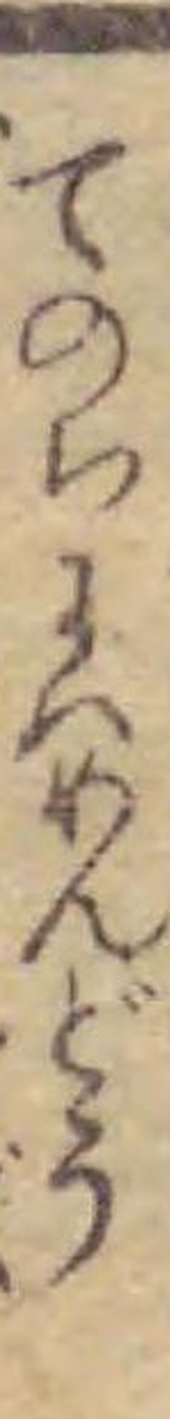てのらにはめんどう
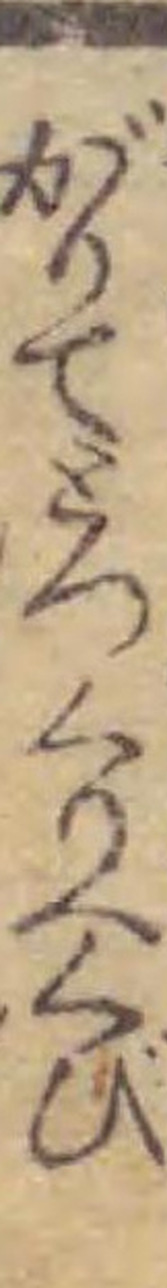がりてとつくりへくび
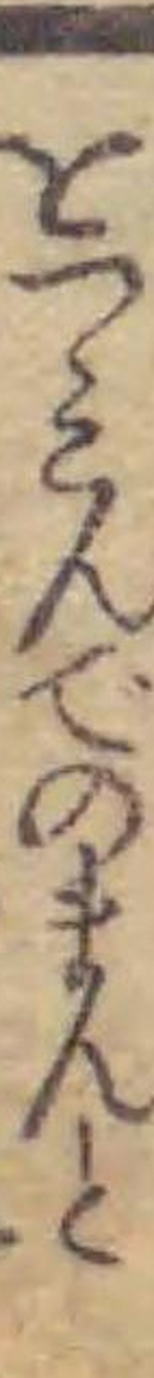をつゝこんでのまんと
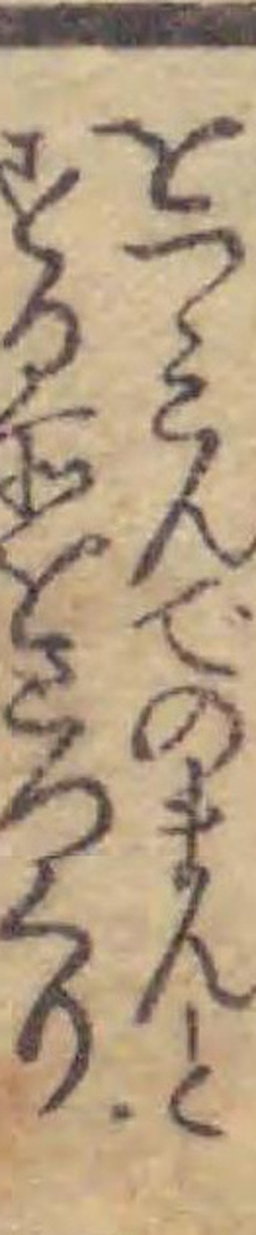する所をとつくり
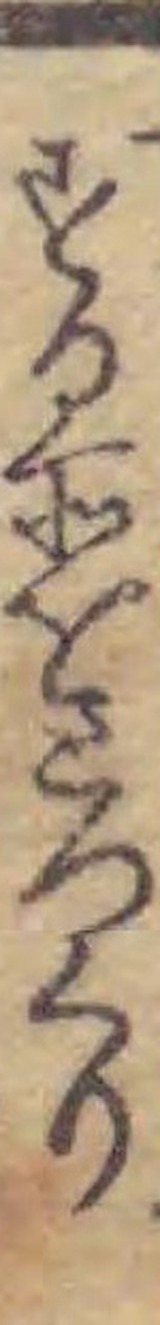する所をとつくり
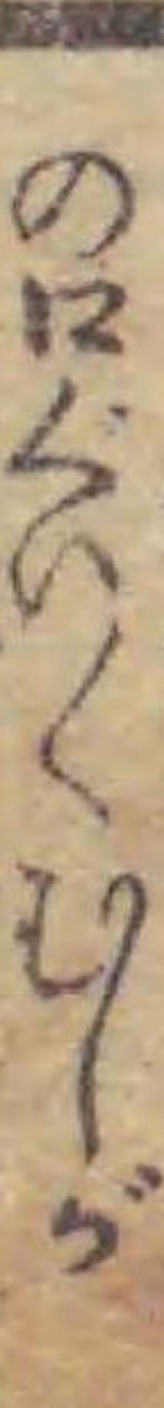の口ぐい〳〵むしが
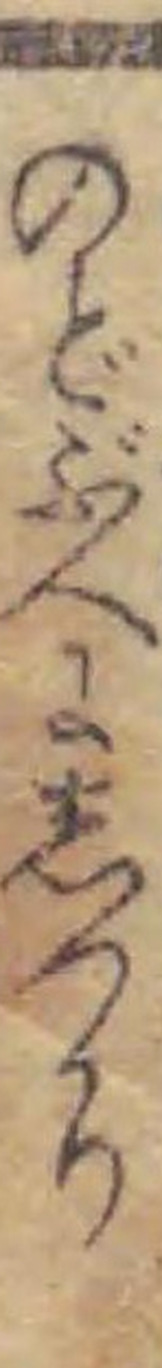のどぶへにしつかり
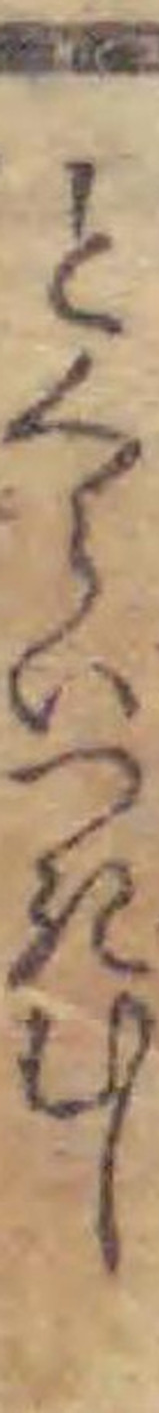とくらいつきむし
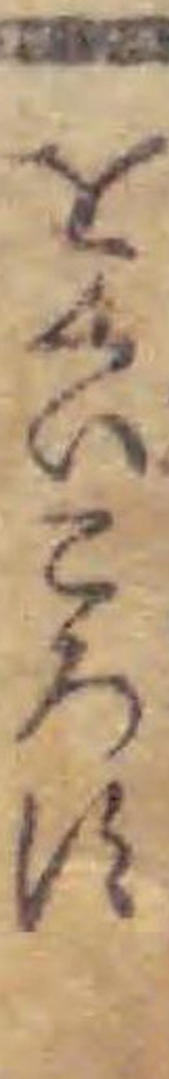をくいころす
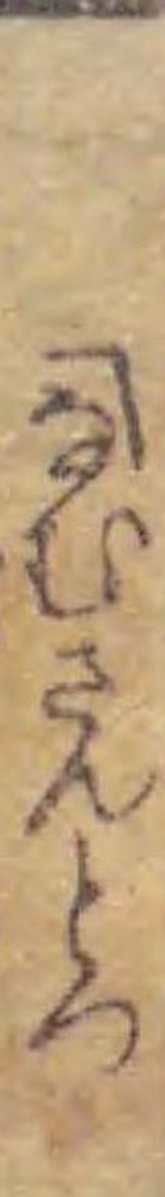〽なむさんとつ
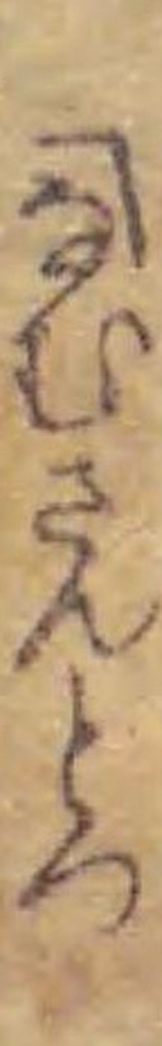〽なむさんとつ
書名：十四傾城腹之内 : 3巻
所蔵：国立国会図書館 National Diet Library, JAPAN
